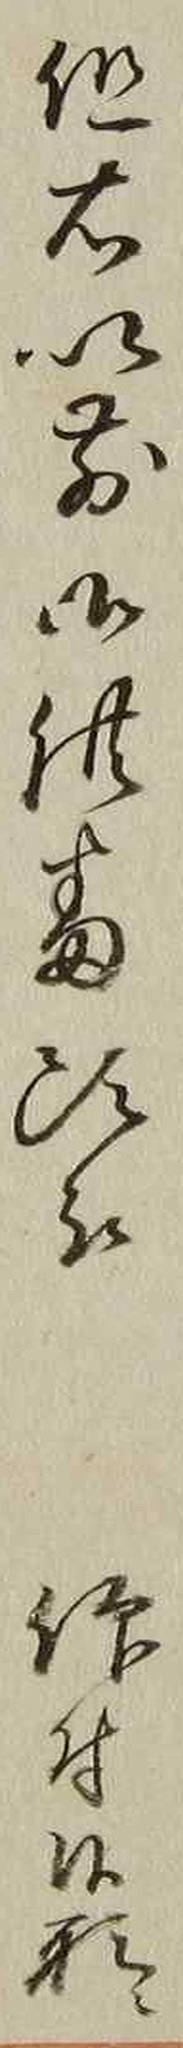但右以前御供番頭被仰付候形に
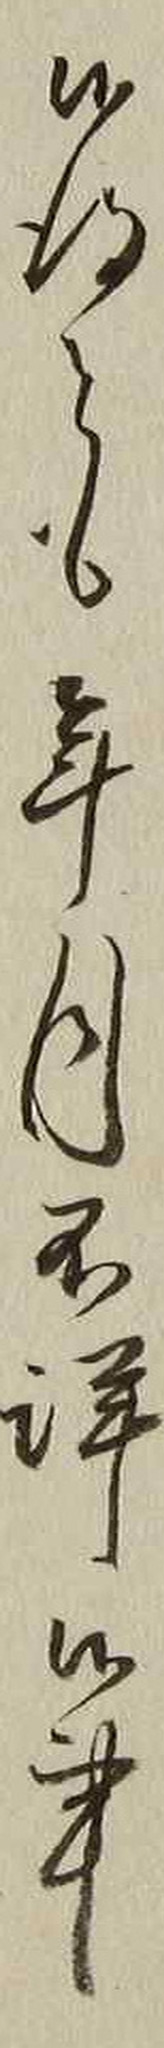候得とも年月不詳候事
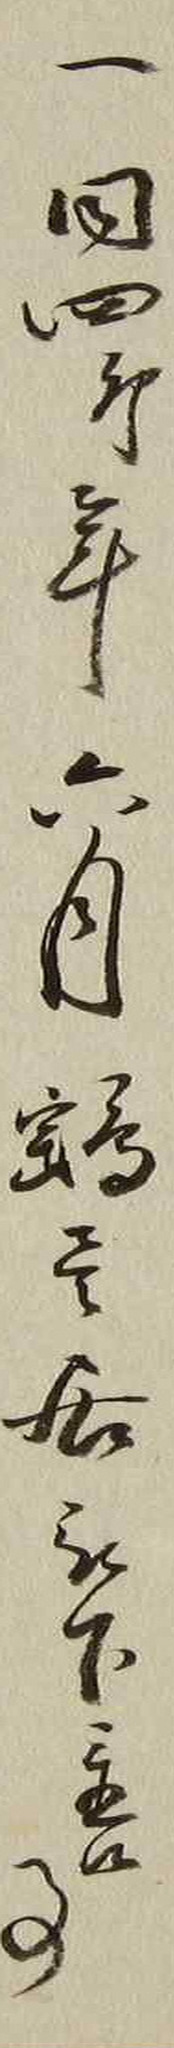一同四卯年六月鶴壱居被下置候事
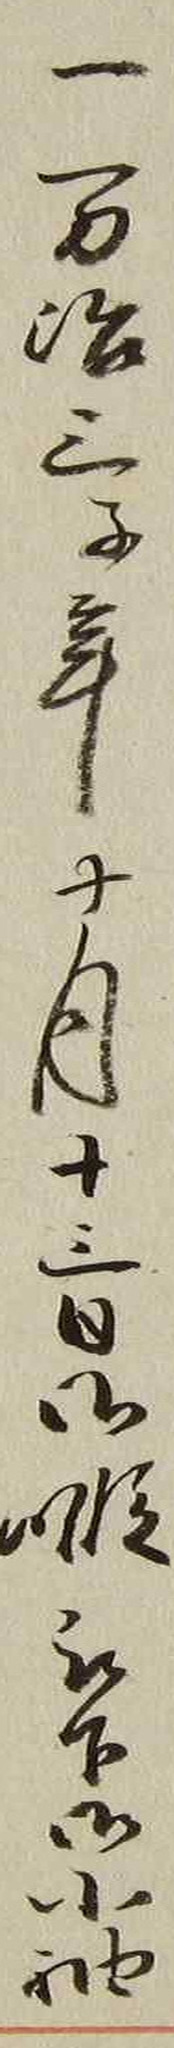一万治三子年十月十三日御暇被下御小袖
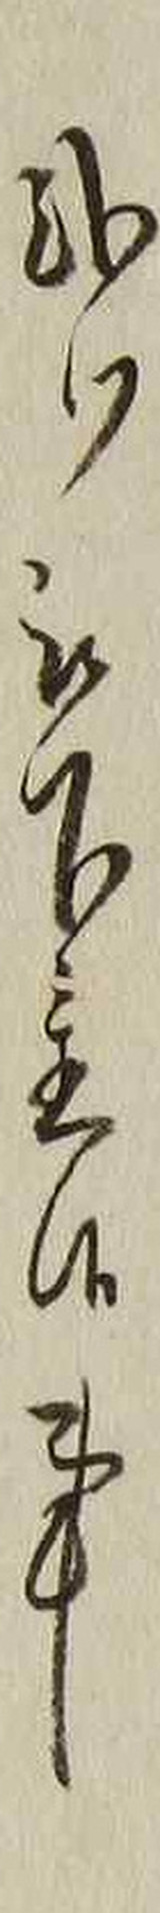弐つ被下置候事
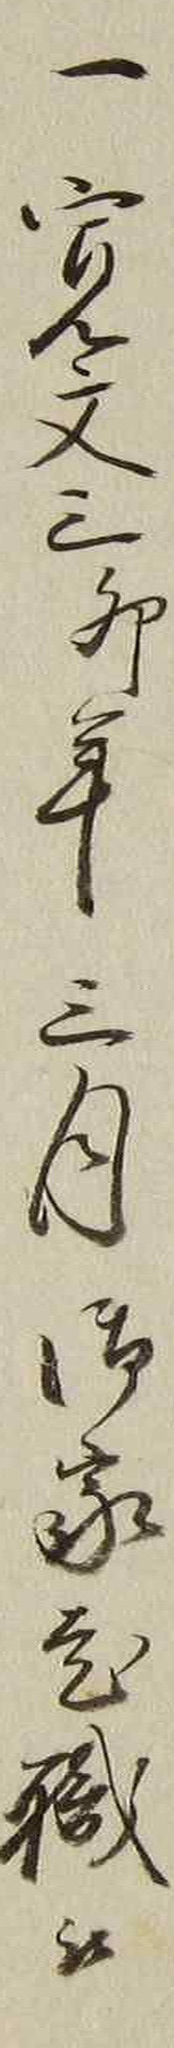一寛文三卯年三月御家老職被
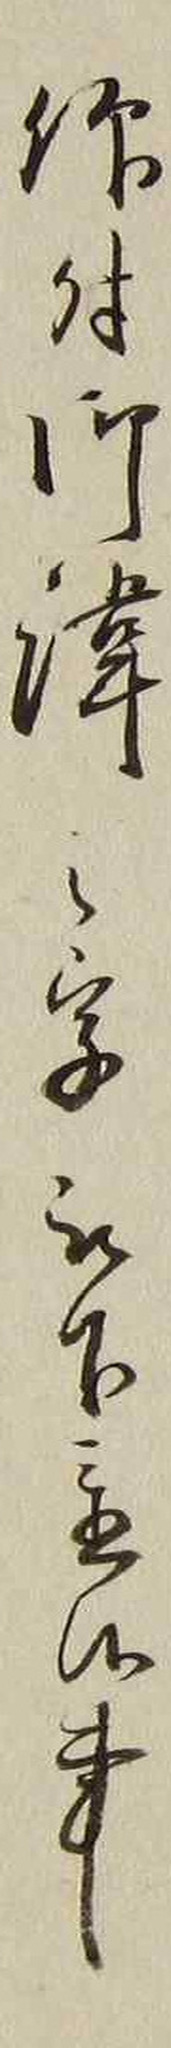仰付諱之字被下置候事
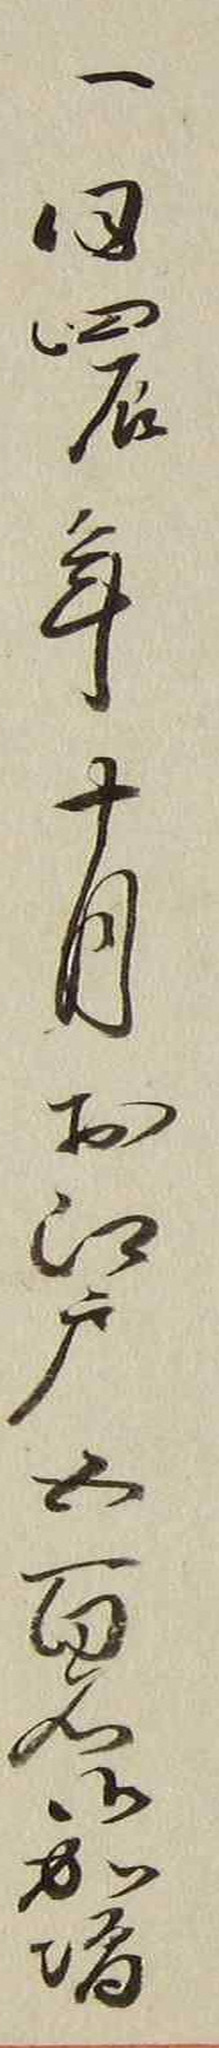一同四辰年十月於江戸五百石御加増
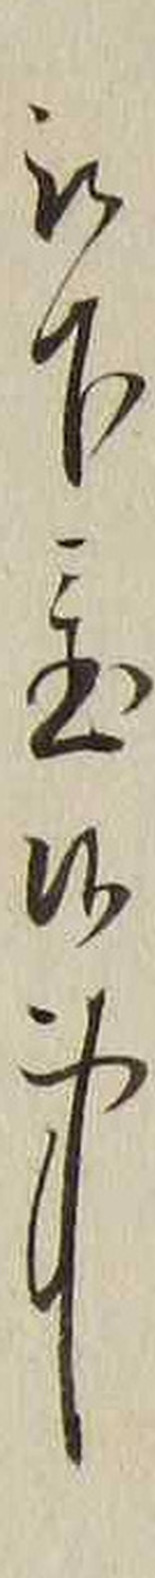被下置候事

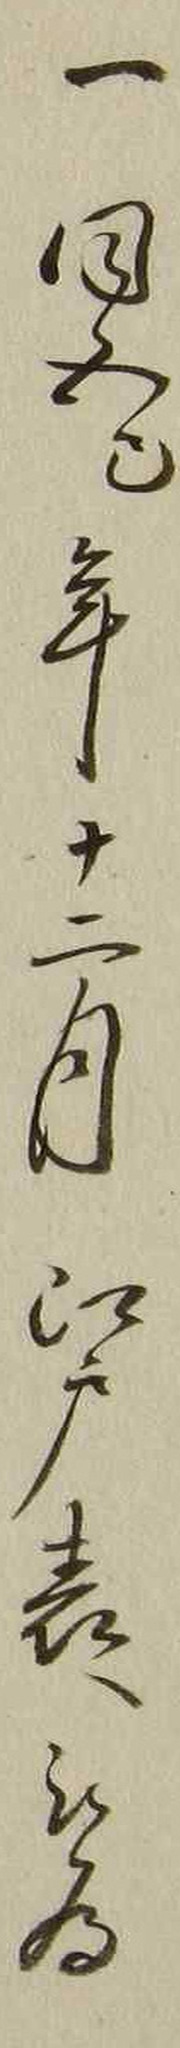一同五巳年十二月江戸表へ被為
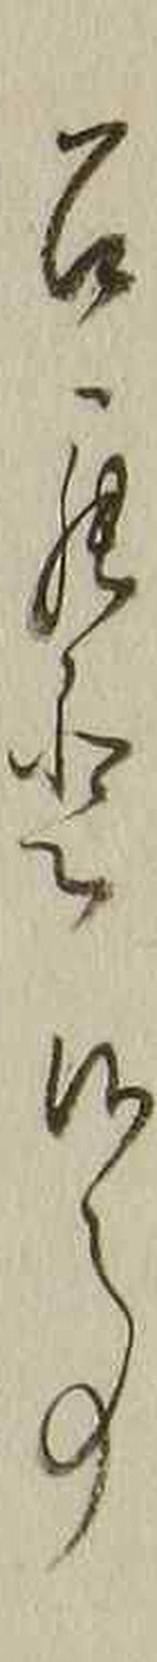召罷登候事
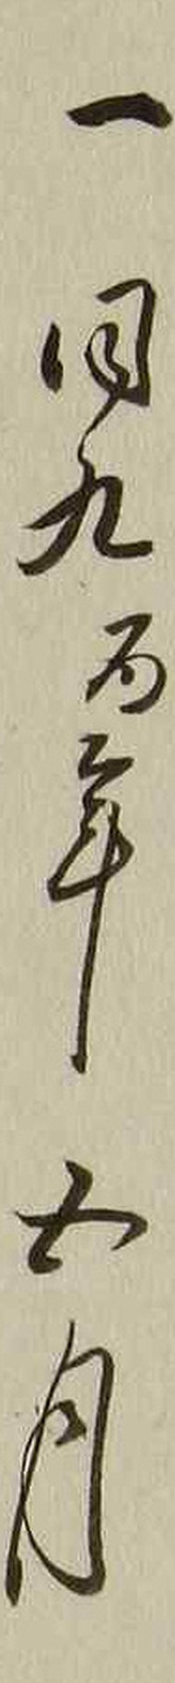一同九酉年五月
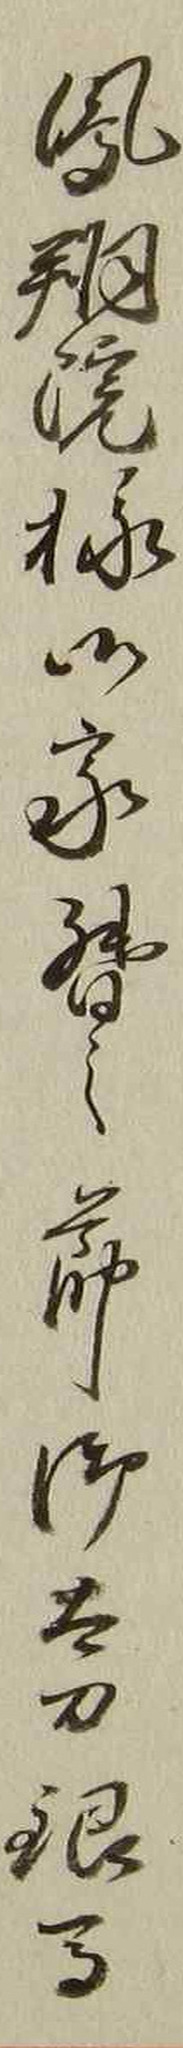鳳翔院様御家督之節御太刀銀馬
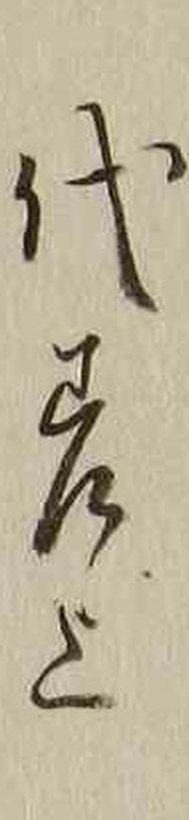代差上
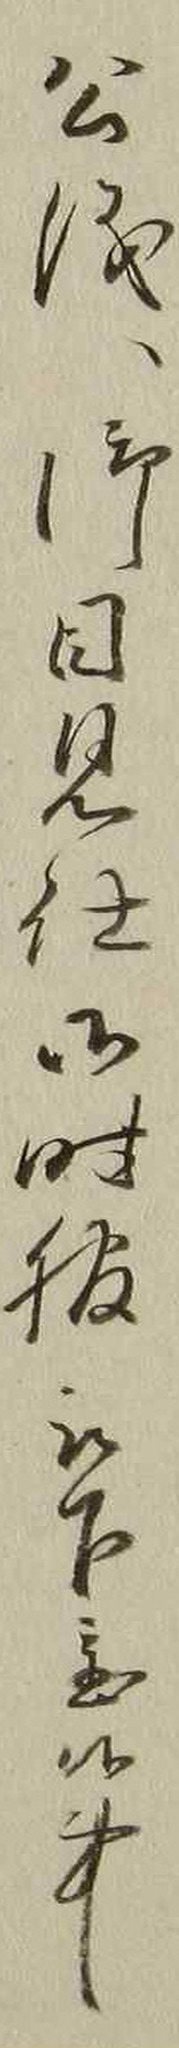公儀へ御目見仕御時服被下置候事
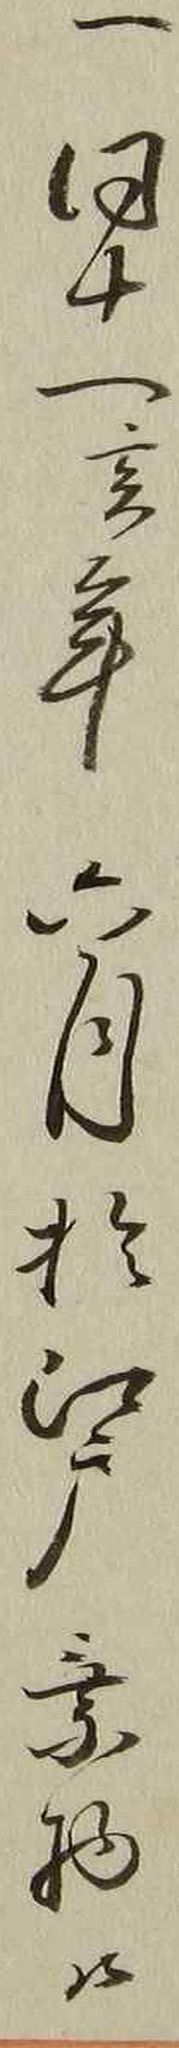一同十一亥年六月於江戸乗物被
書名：諸士系譜　巻之204　や之部1
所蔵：会津若松市立会津図書館
